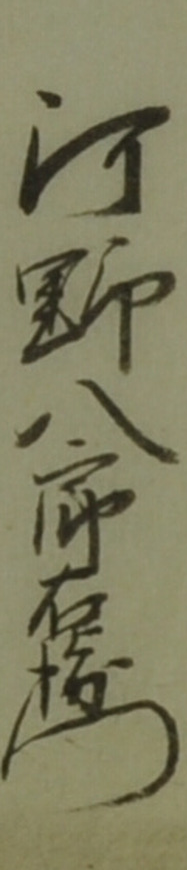河野八郎右衛門
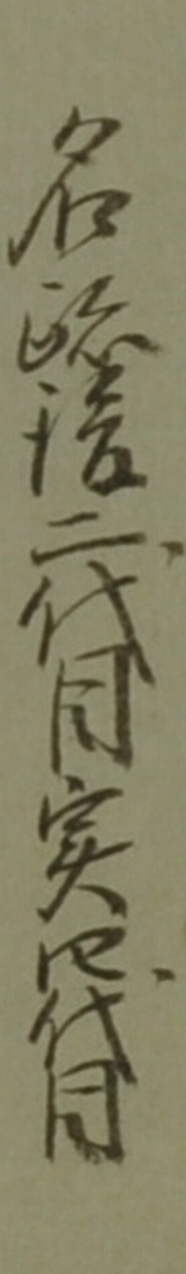名跡後二代目実四代目
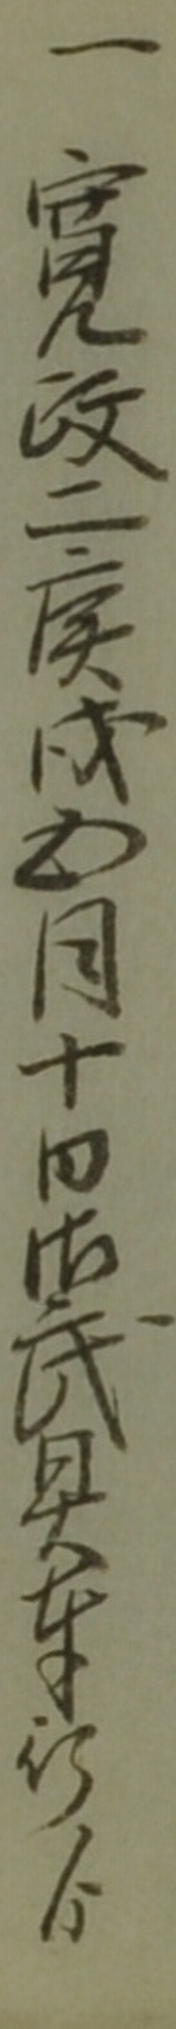一寛政二庚戌五月十日御武具奉行ゟ
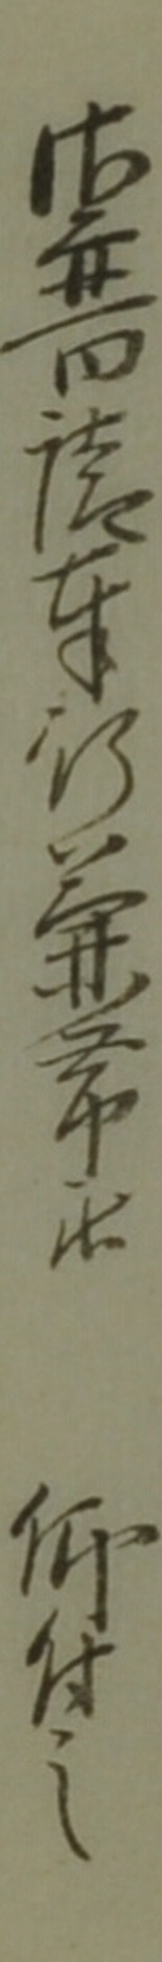御普請奉行兼帯被仰付之
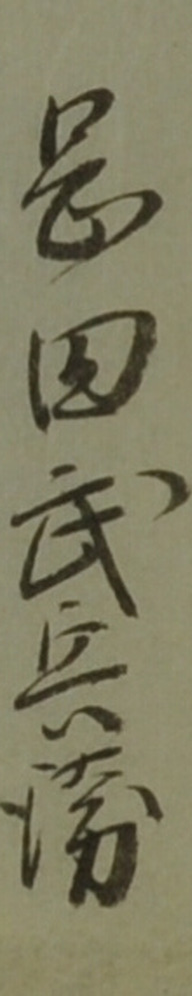岡田武兵衛
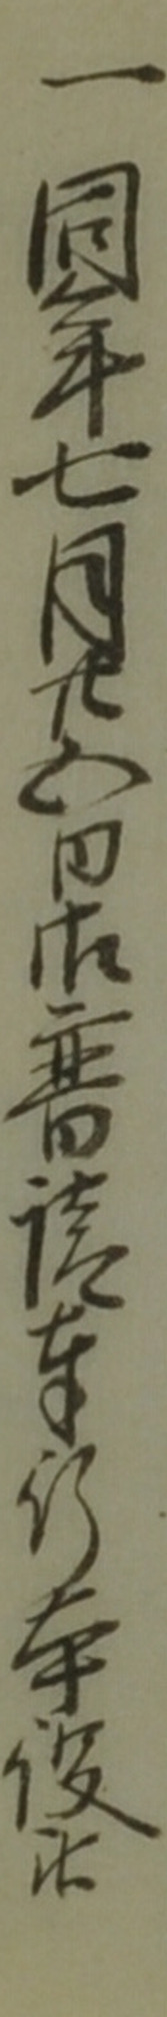一同年七月廿五日御普請奉行本役被
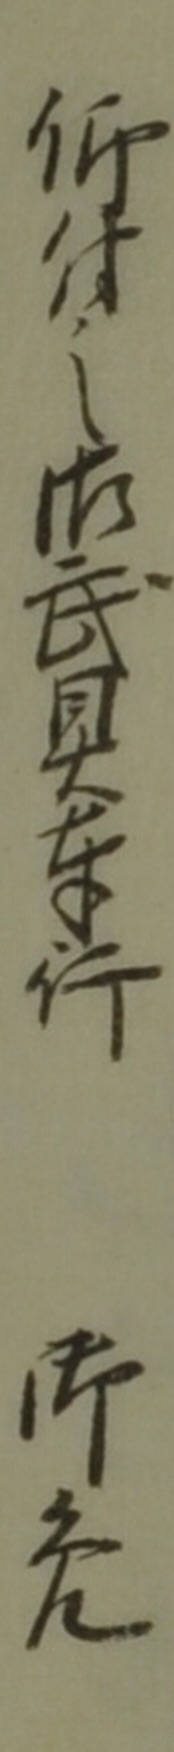仰付之御武具奉行御免
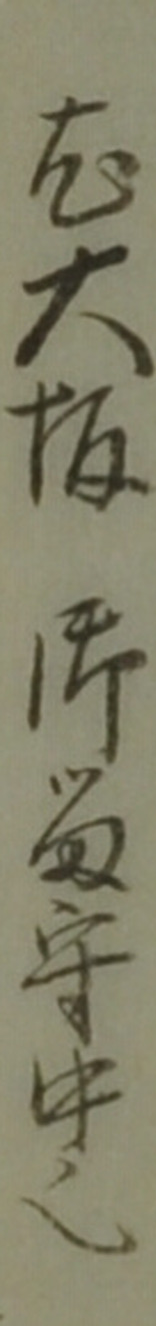尤大坂御留守中也
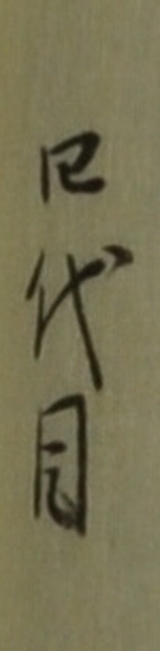四代目
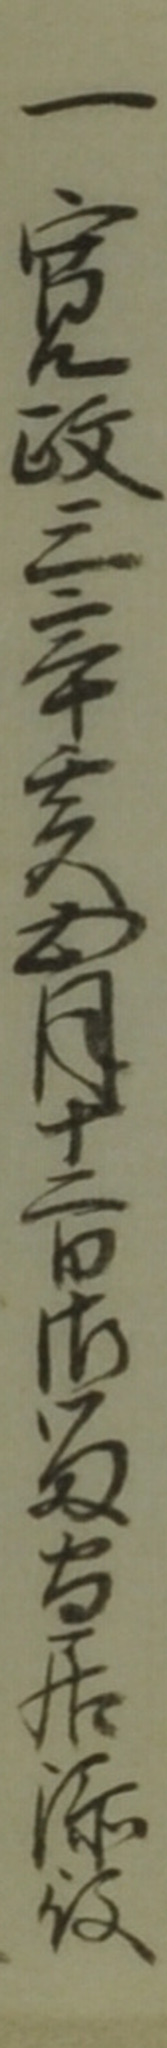一寛政三辛亥五月十二日御留守居添役
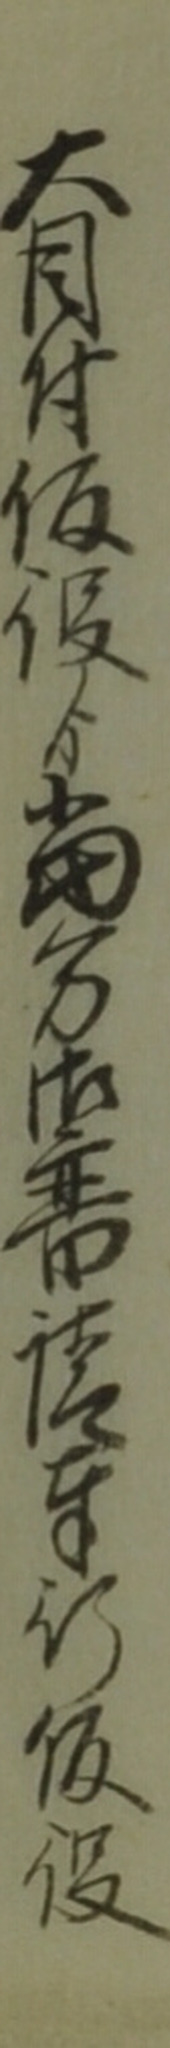大目付仮役ゟ当分御普請奉行仮役
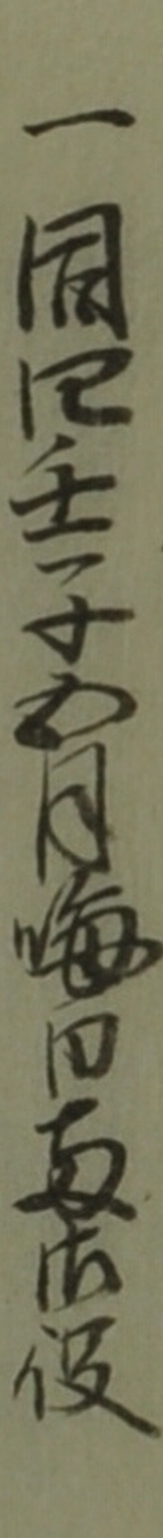一同四壬子五月晦日両御役
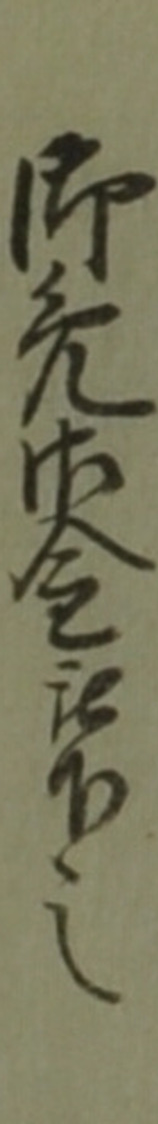御免御金被下之
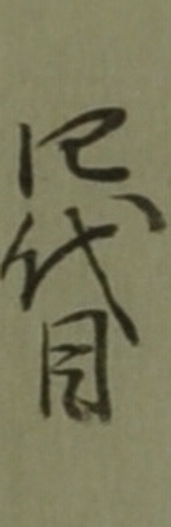四代目
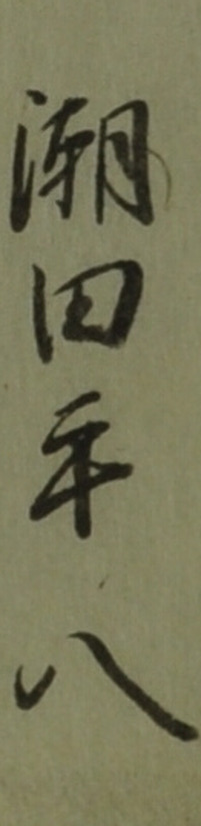潮田平八
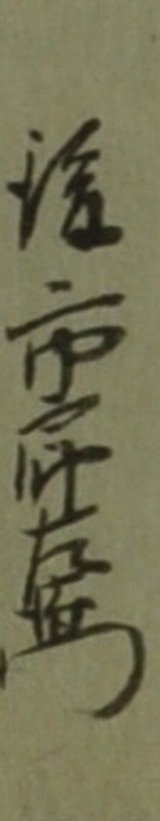後市郎左衛門
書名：諸御役代々録（六）
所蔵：伊那市立高遠町図書館・合同会社AMANE
